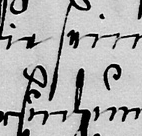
5.
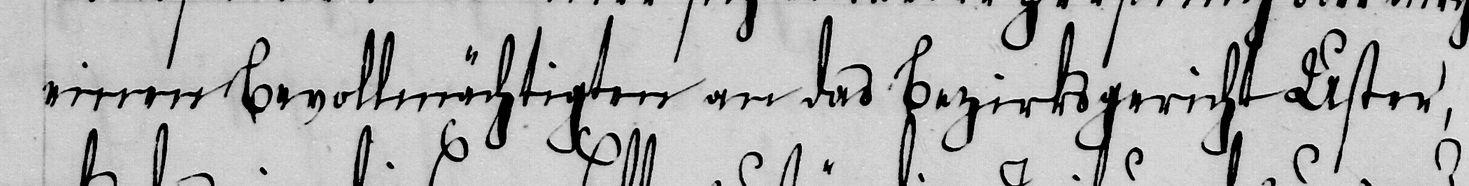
einen Bevollmächtigten an das Bezirksgericht Uster,
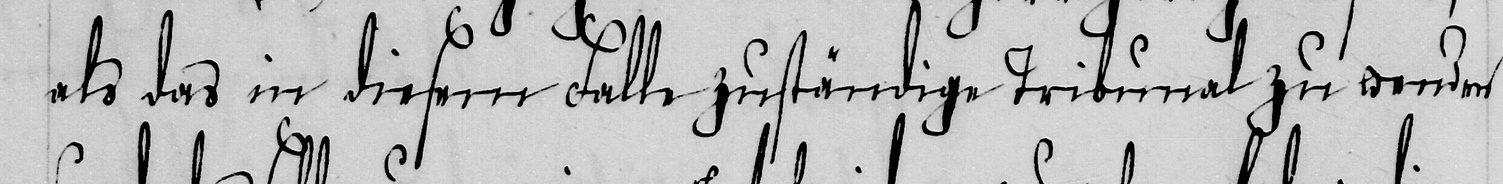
als das in diesem Falle zuständige Tribunal zu wenden
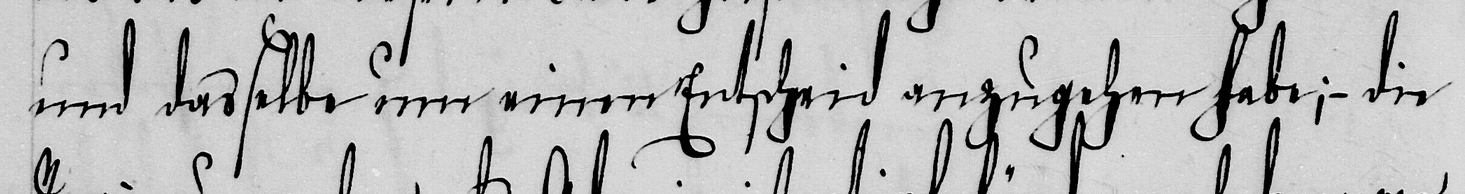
und dasselbe um einen Entscheid anzugehen habe; – die
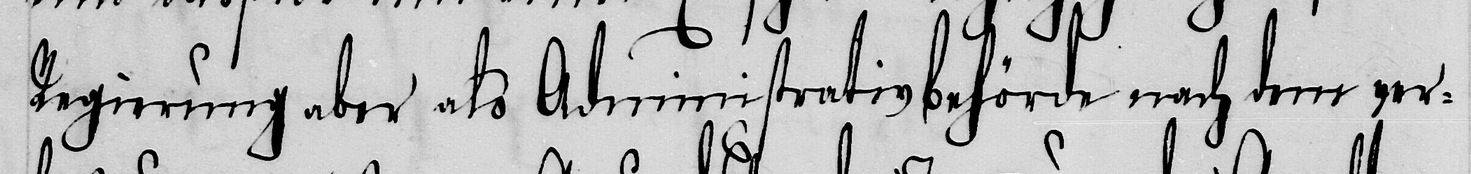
Regierung aber als Administrativbehörde nach dem ver¬
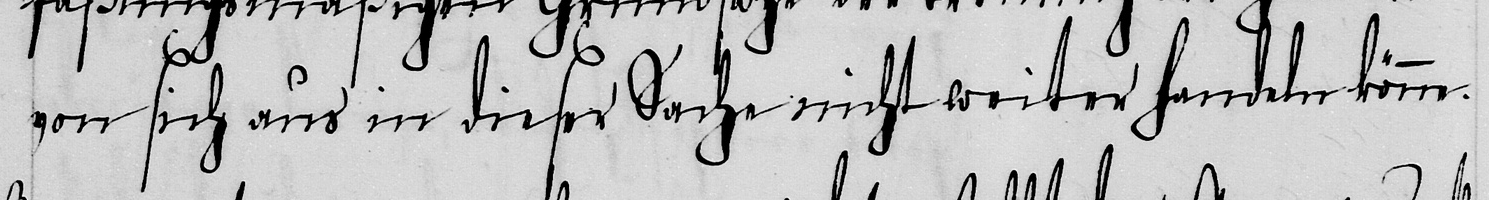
von sich aus in dieser Sache nicht weiter handeln könne.
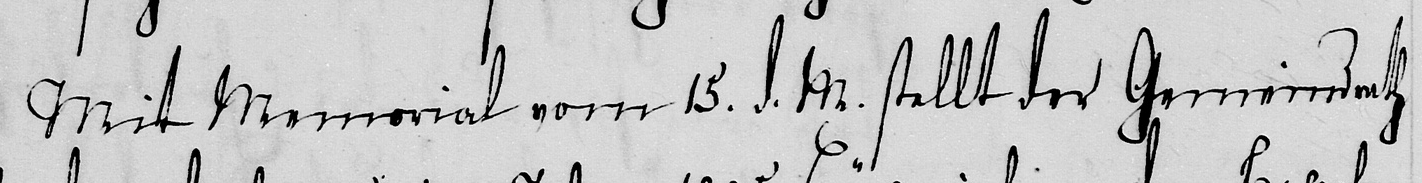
Mit Memorial vom 15. d. M. stellt der Gemeindrath
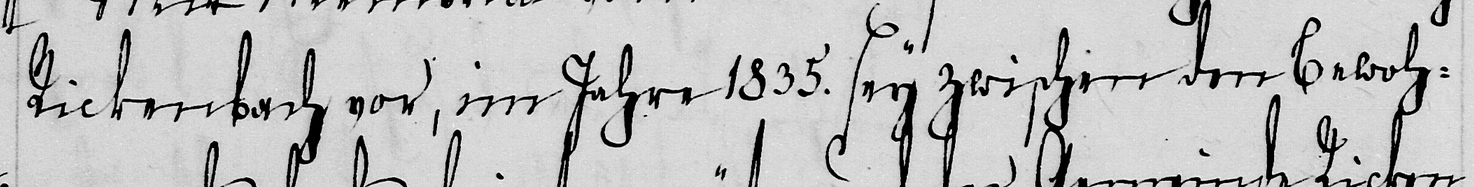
Rickenbach vor, im Jahre 1835. sey zwischen den Bewoh¬
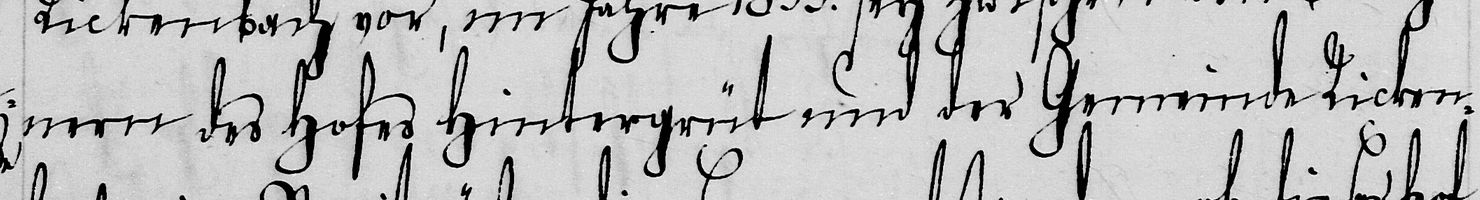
nern des Hofes Hintergrüt und der Gemeinde Ricken¬
